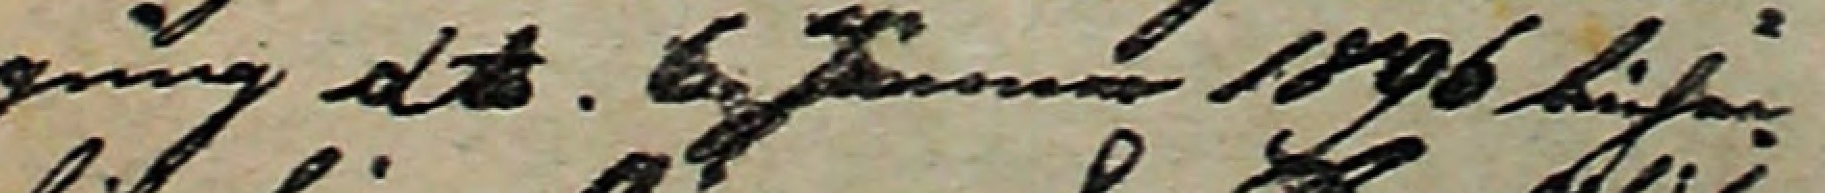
gung dto. 6. Jänner 1896 buchen=
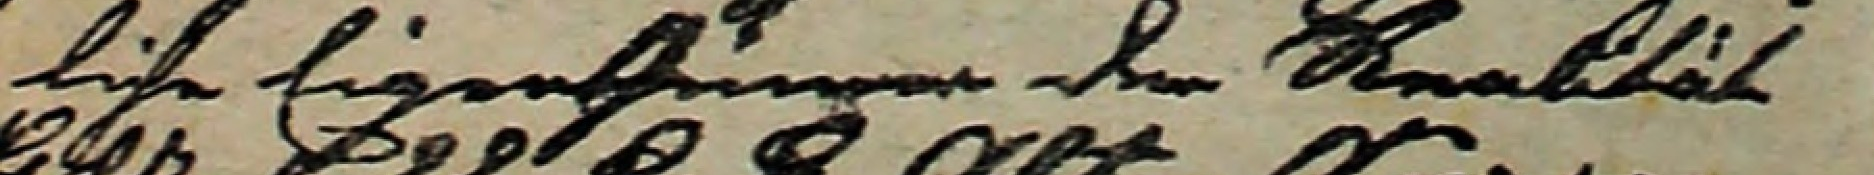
liche Eigenthumer den Realität
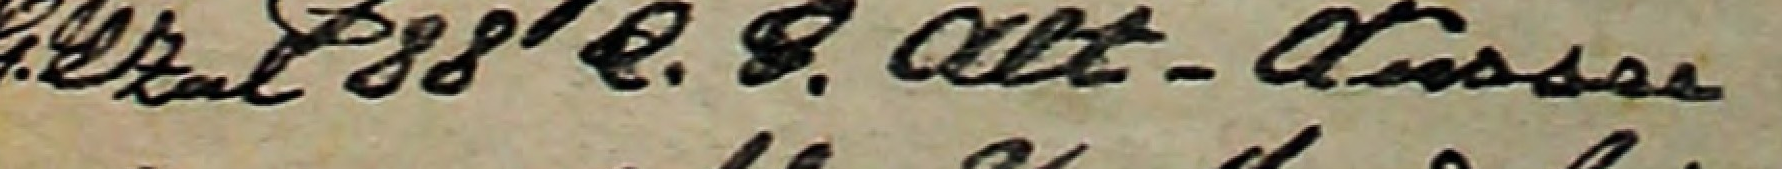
G.d Zal 88 C.G. Alt - Aussee
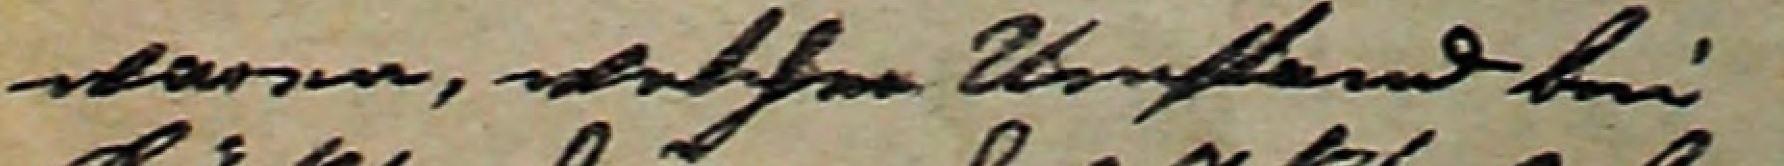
waren, welchen Umstand bei
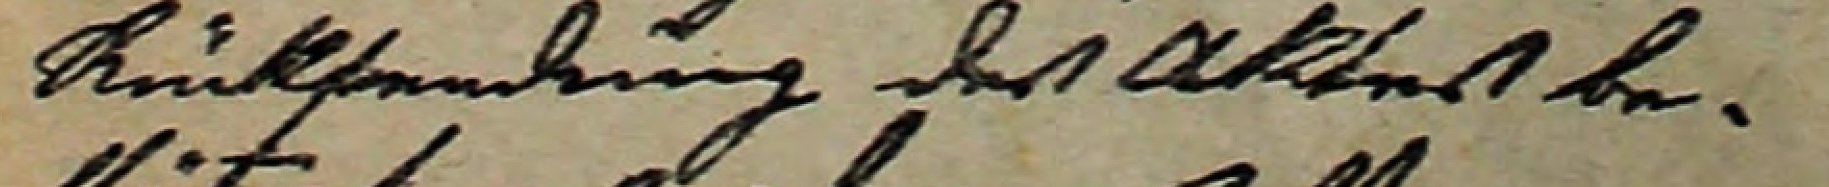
Rückfandung des Aktes be=
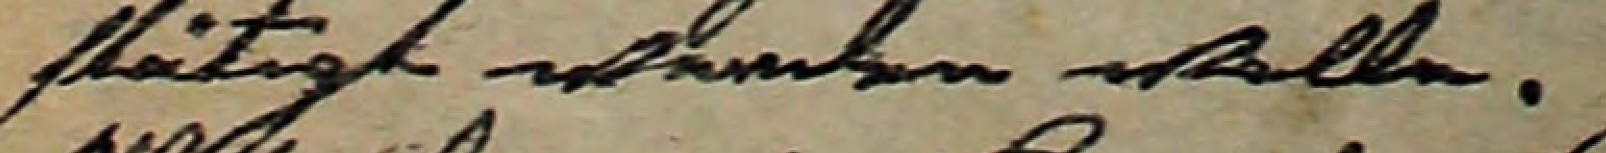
stätigt werden wallen.
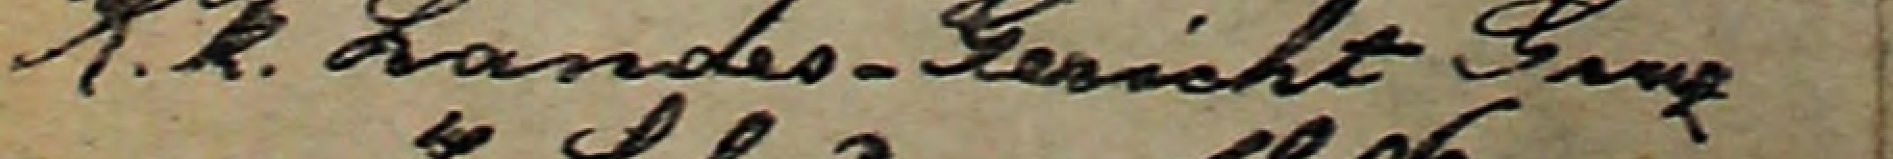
k.k. Landes - Gericht Graz
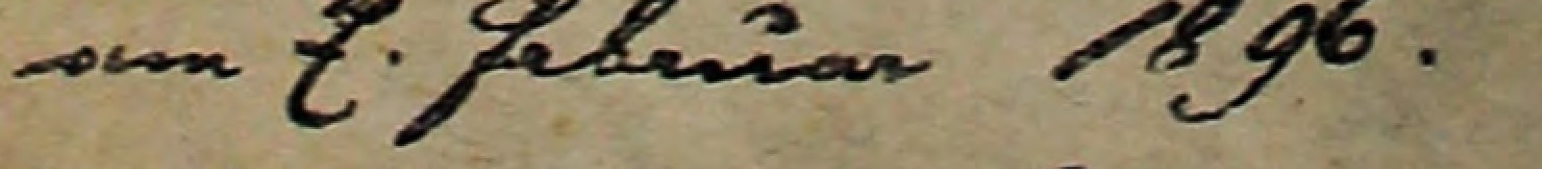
am 7. Februar 1896.
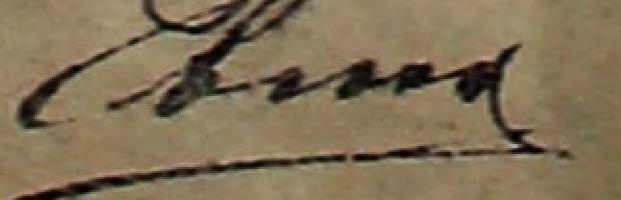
Ebned
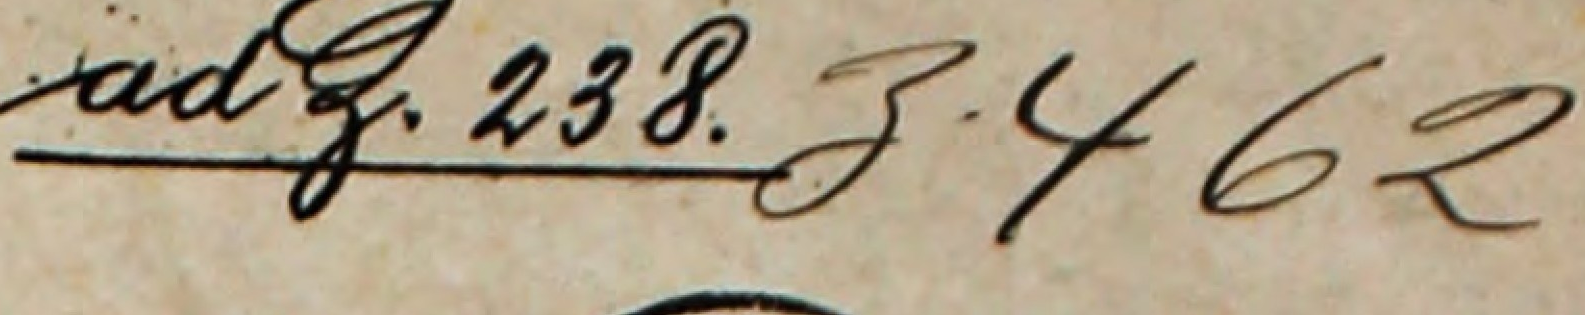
ad Z. 238. 3462
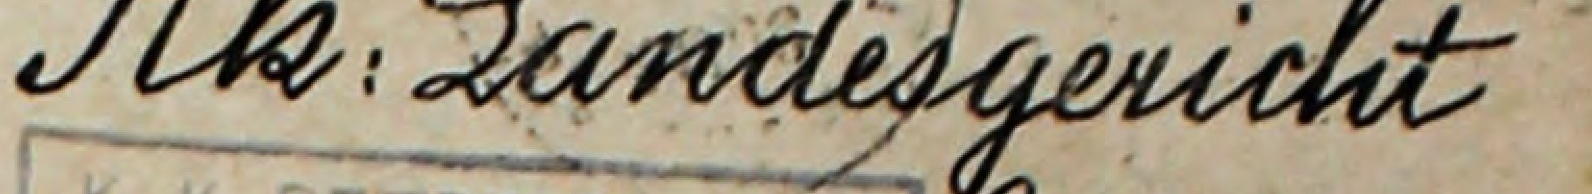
Kk: Landesgericht
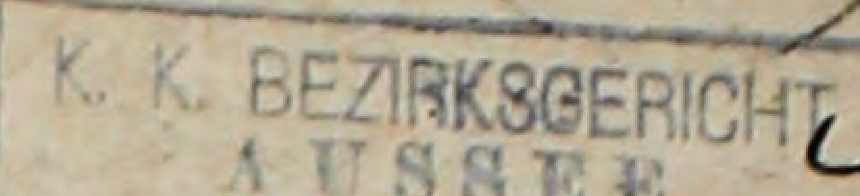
K. K. BEZIRKSGERICHT
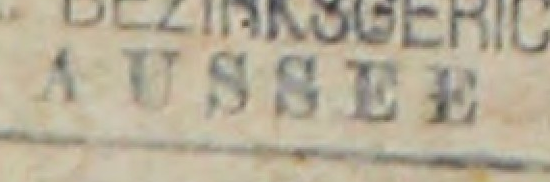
AUSSEE
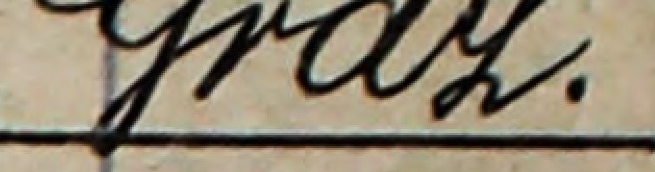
Graz.
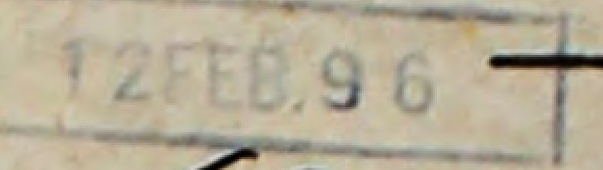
12 FEB. 96
